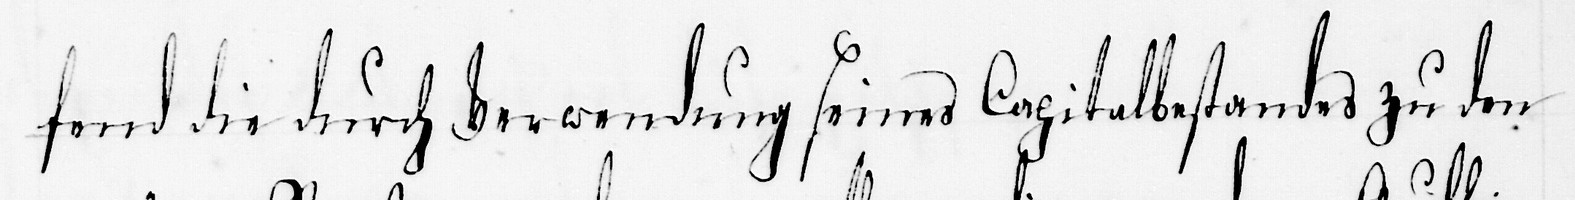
fend die durch Verwendung seines Capitalbestandes zu den
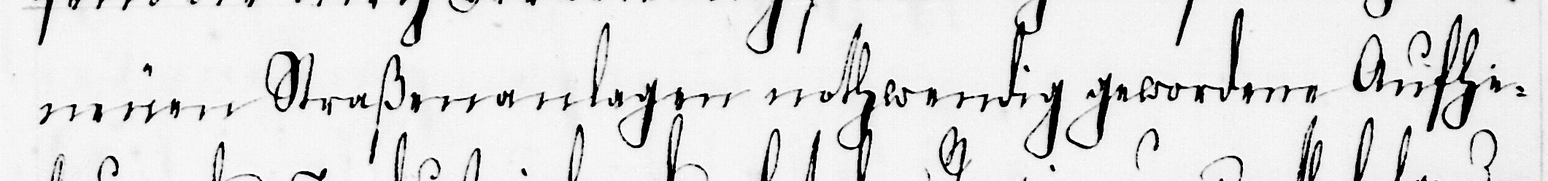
neuen Straßenanlagen nothwendig gewordene Aufhe¬
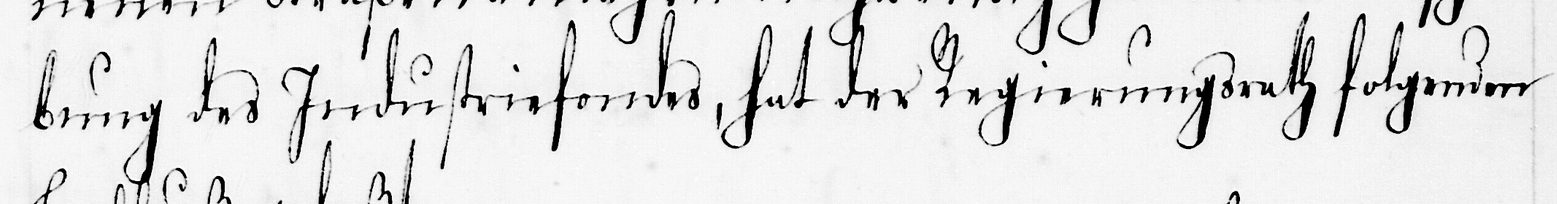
bung des Industriefondes, hat der Regierungsrath folgenden
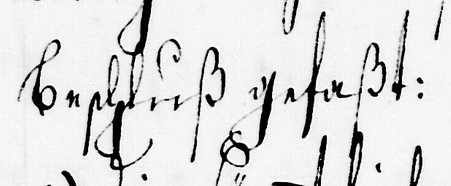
Beschluß gefaßt:
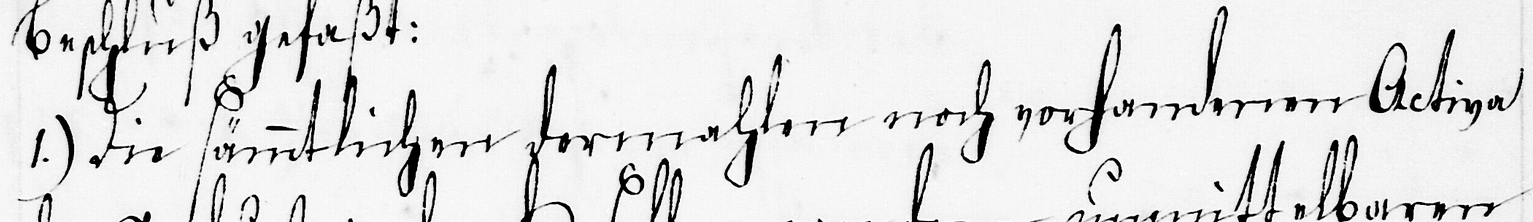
1.) Die sämmtlichen dermahlen noch vorhandenen Activa
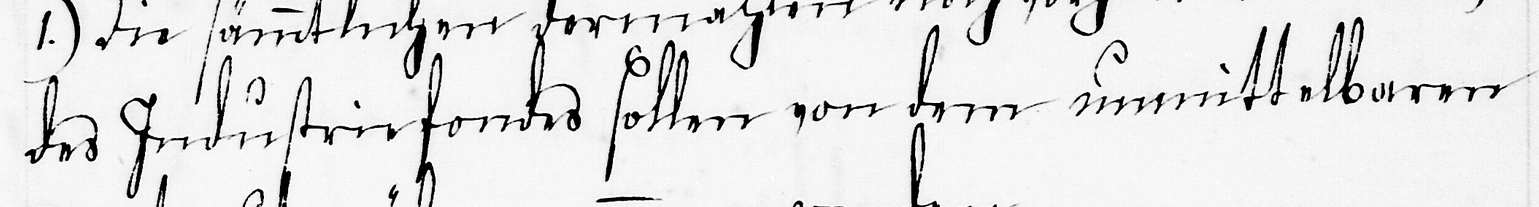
des Industriefondes sollen von dem unmittelbaren
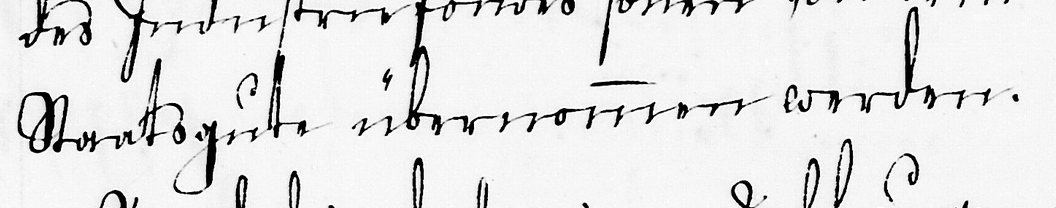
Staatsgute übernommen werden.
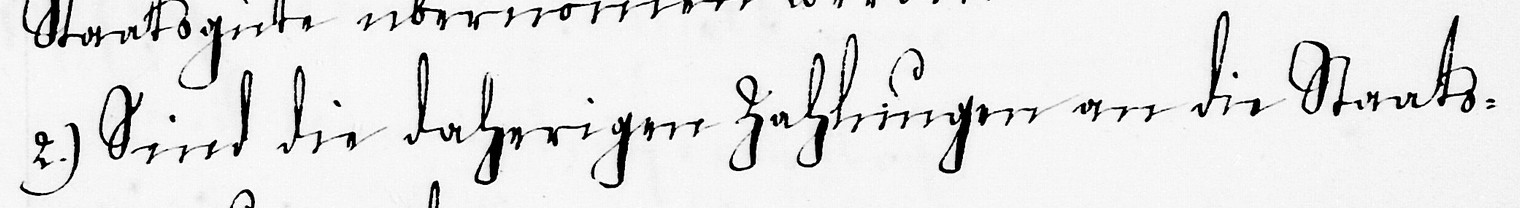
2.) Sind die daherigen Zahlungen an die Staats¬
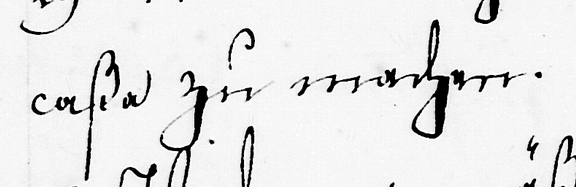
caßa zu machen.
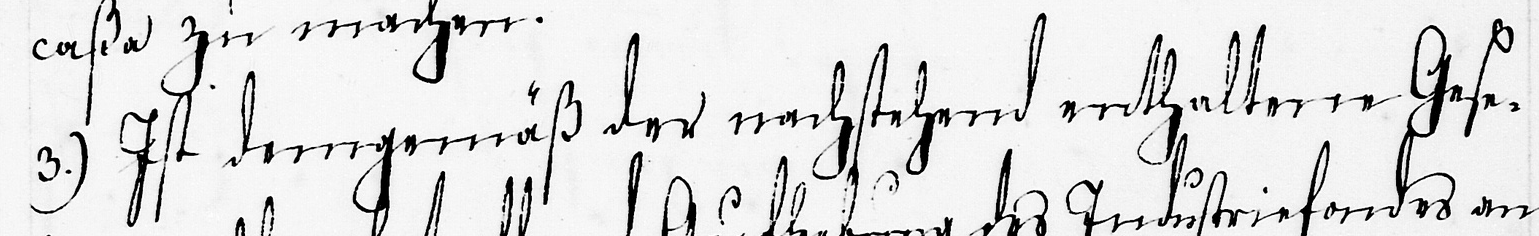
3.) Ist demgemäß der nachstehend enthaltene Gese¬
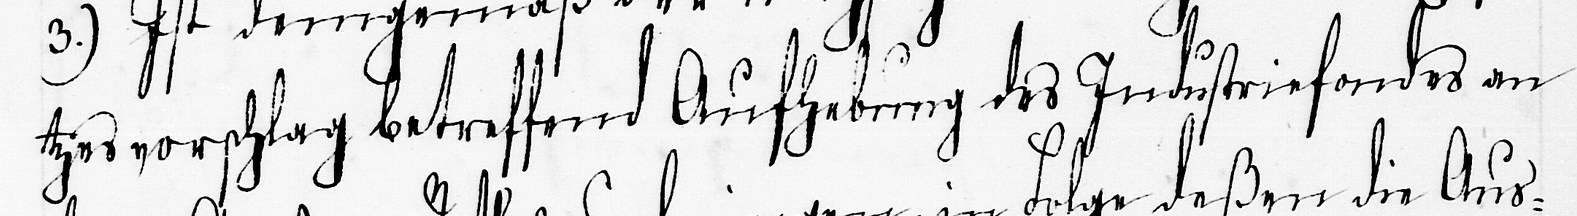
tzesvorschlag betreffend Aufhebung des Industriefondes an
